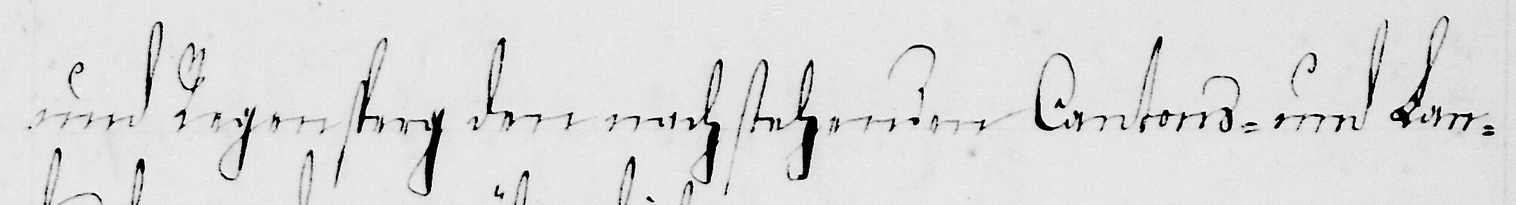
und Regensperg den nachstehenden Cantons- und Lan¬
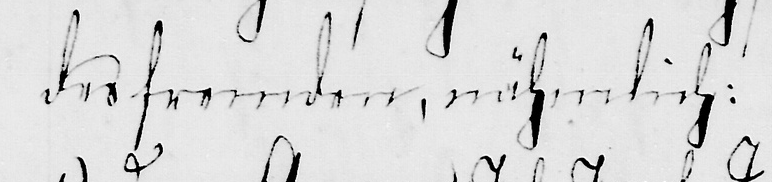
desfremden, nähmlich:
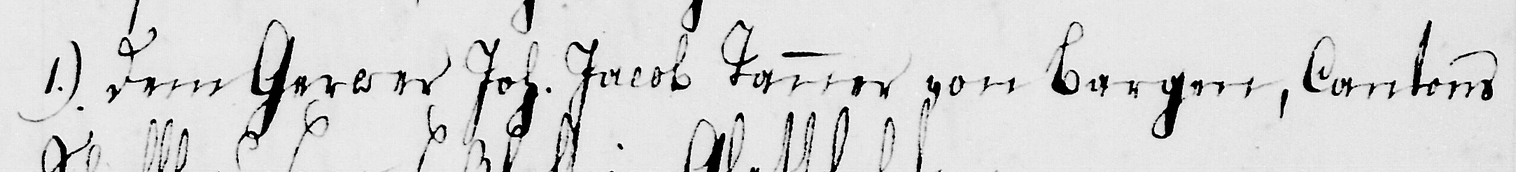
1.) Dem Gerwer Joh. Jacob Tanner von Bargen, Cantons
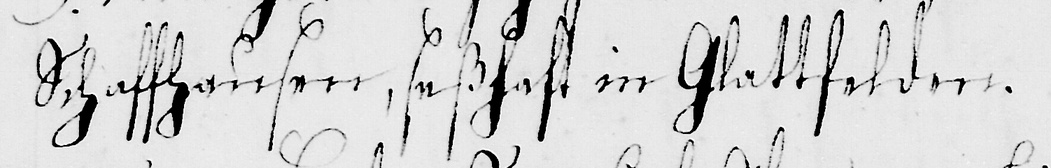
Schaffhausen, seßhaft in Glattfelden.
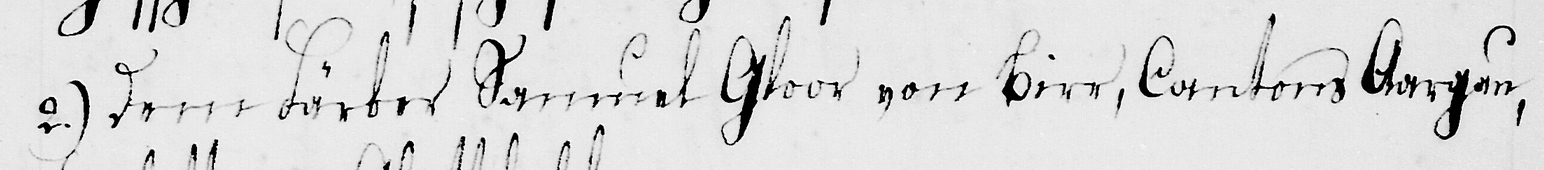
2.) Dem Färber Samuel Gloor von Birr, Cantons Aargau,
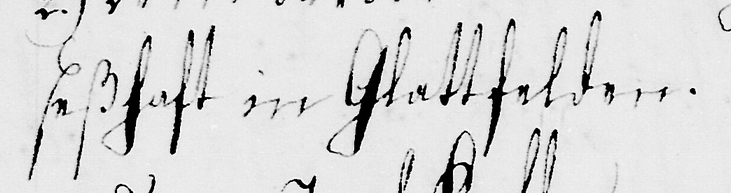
seßhaft in Glattfelden.
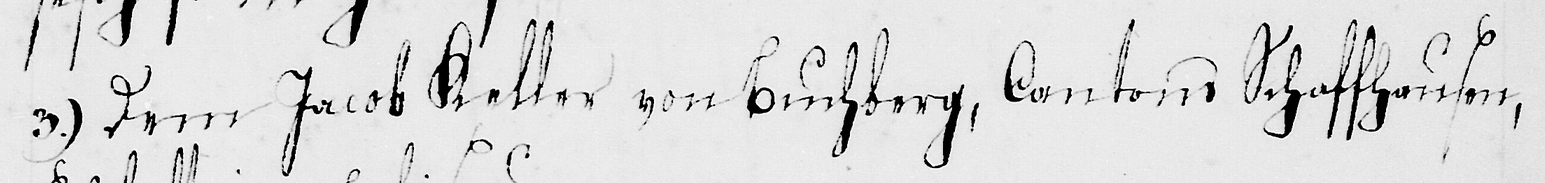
3.) Dem Jacob Keller von Buchberg, Cantons Schaffhausen,
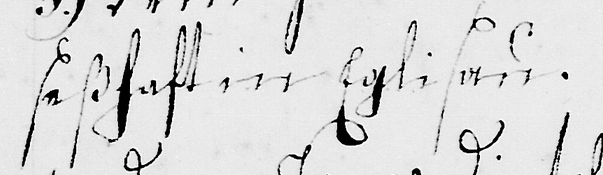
seßhaft in Eglisau.
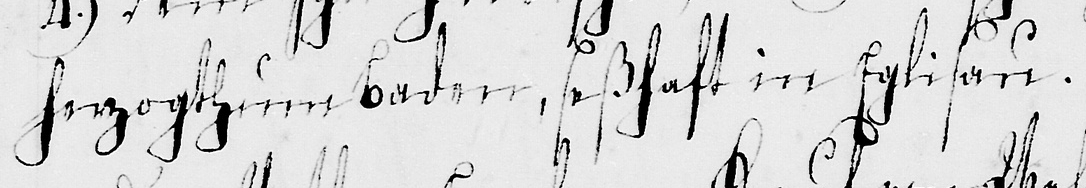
herzogthum Baden, seßhaft in Eglisau.
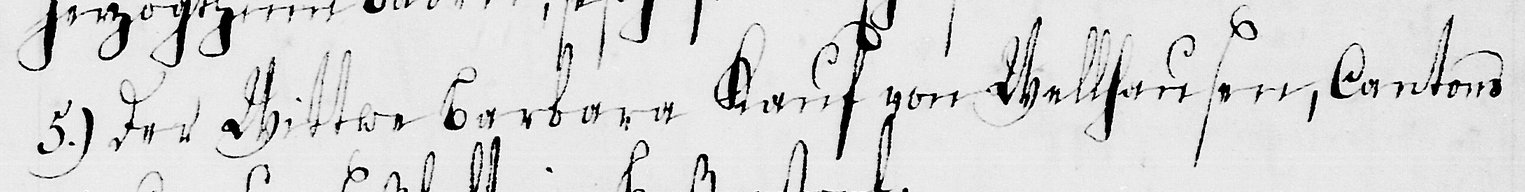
5.) Der Wittwe Barbara Kauf von Wellhausen, Cantons
